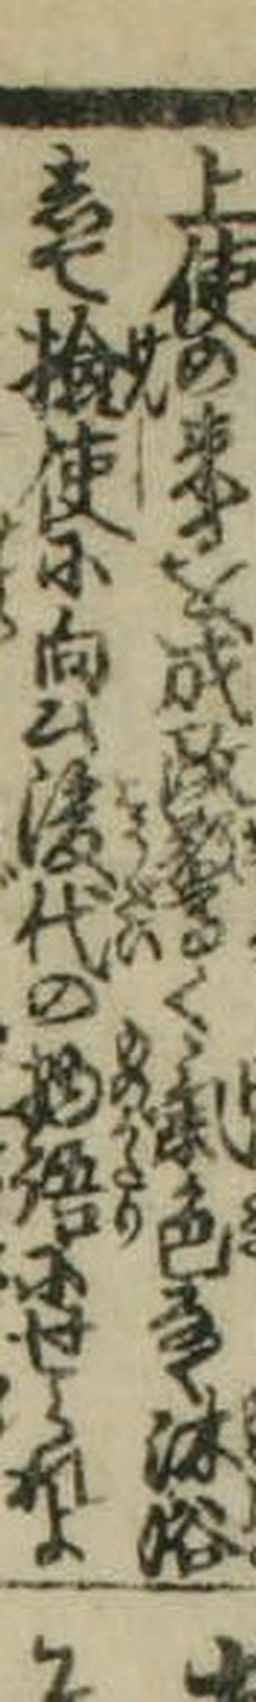して撿使に向ひ後代の物語にせられよ
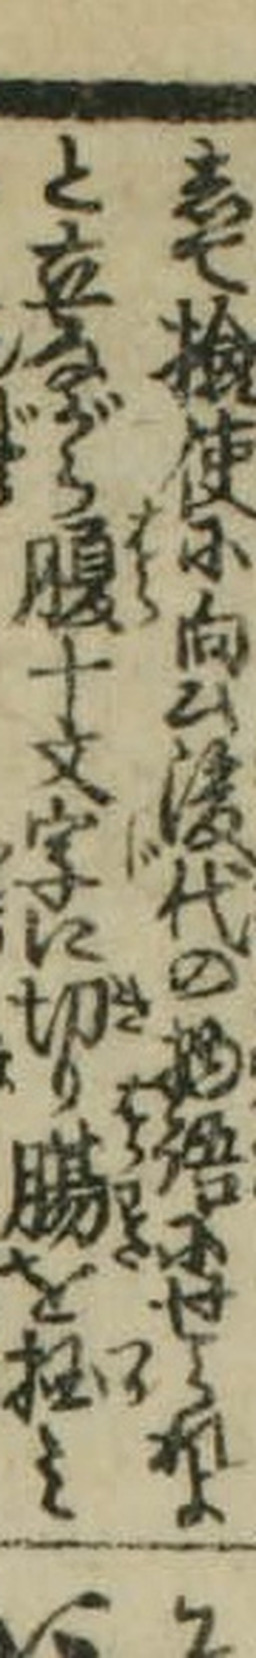と立ながら腹十文字に切り腸を掴み
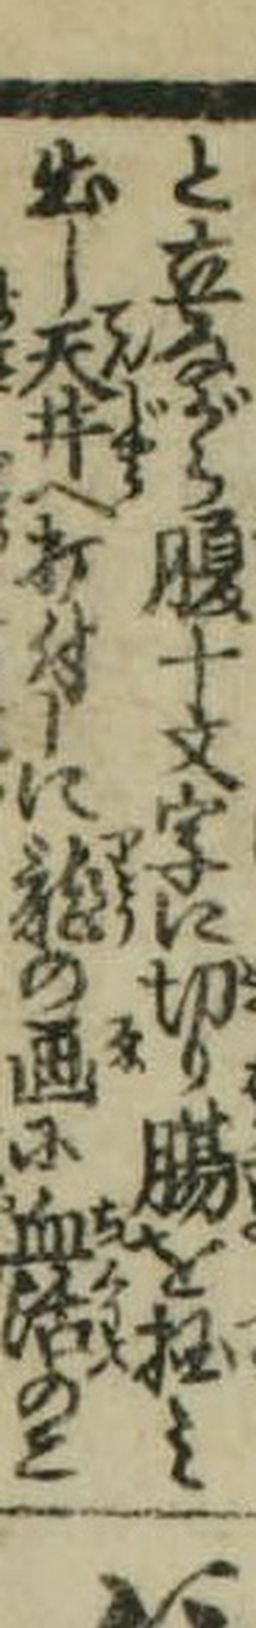出し天井へ打付しに龍の画に血活のこ
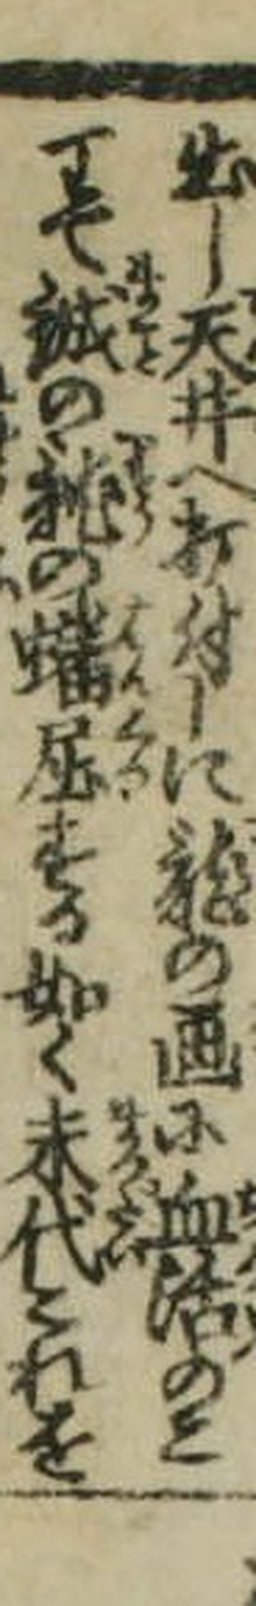りて誠の龍の蟠屈する如く末代これを
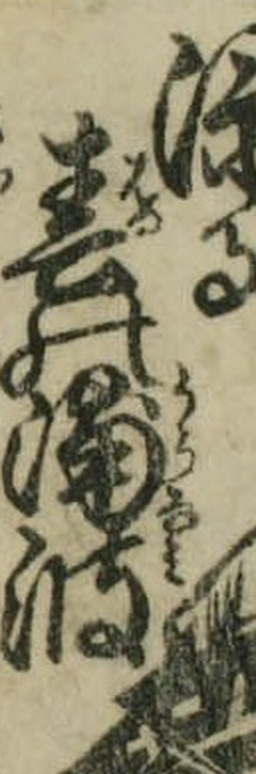春の浦波
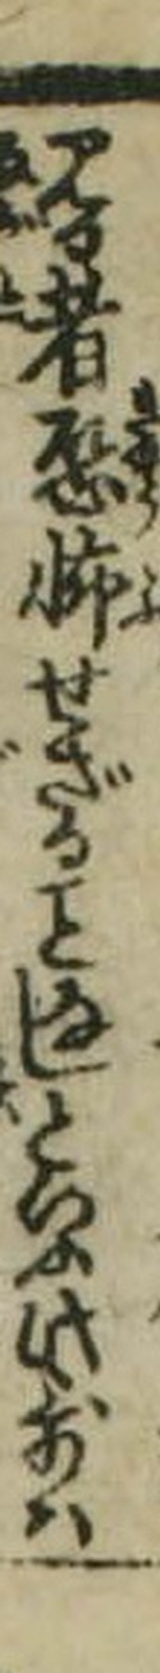見る者恐怖せざることなしといふ此哥は
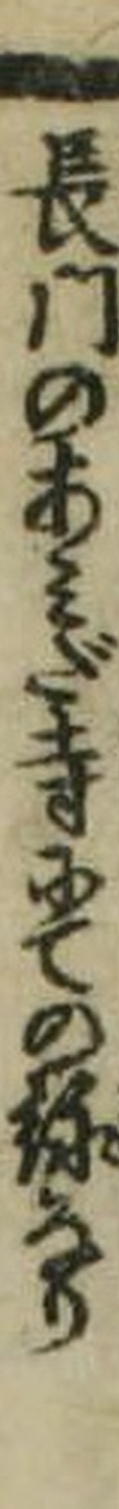長門のあみだ寺にての詠なり
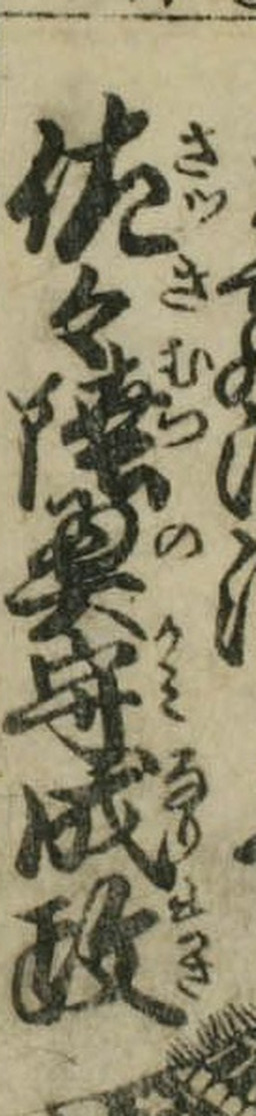佐々陸奥守成政
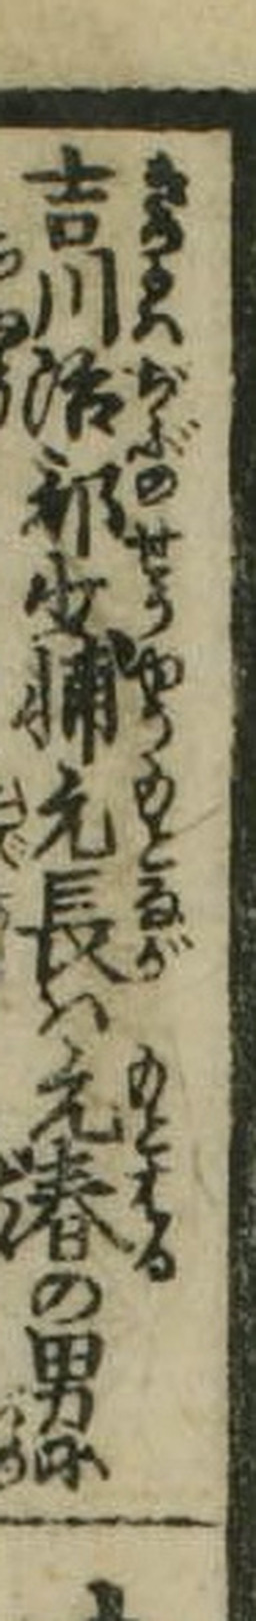吉川治部少輔元長は元春の男に
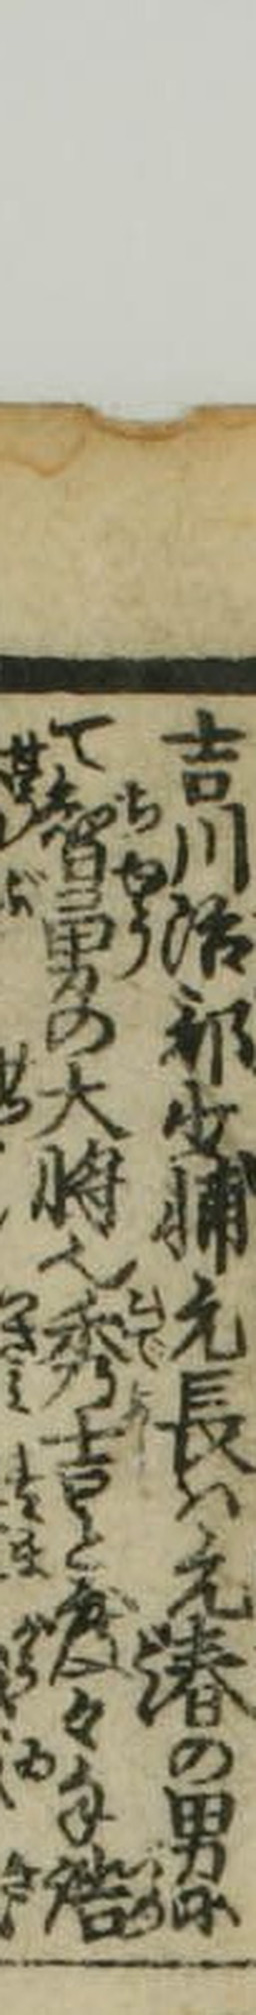て智勇の大将也秀吉と度々手詰
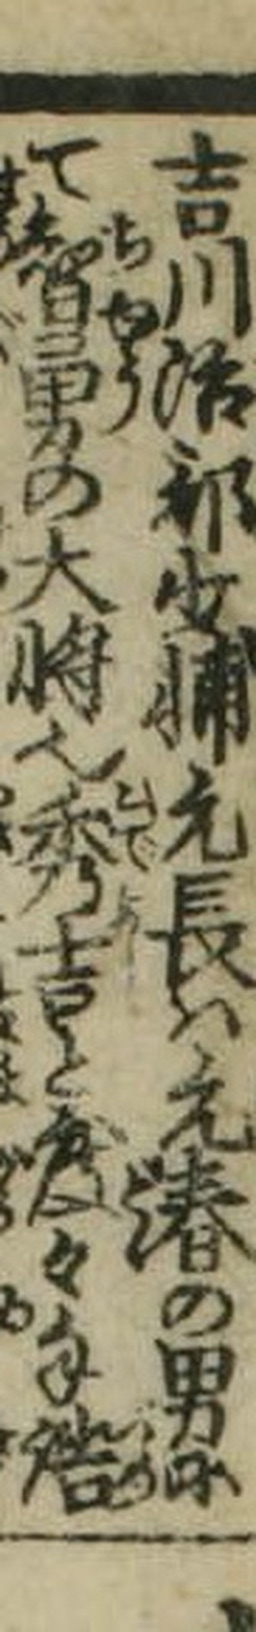て智勇の大将也秀吉と度々手詰
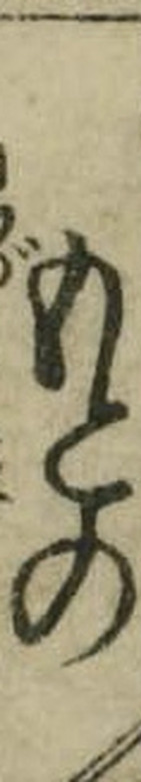もとの
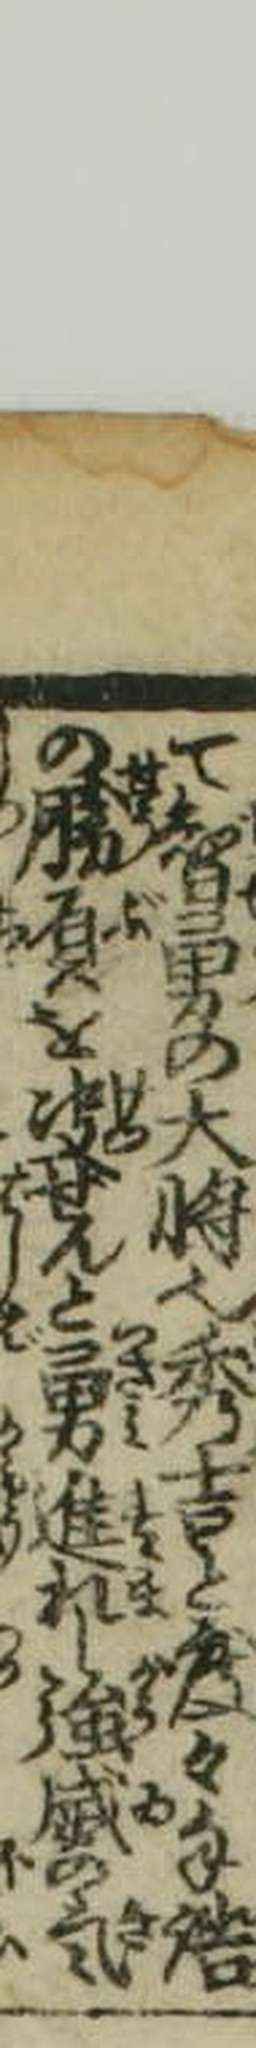の勝負を決せんと勇進れし強威の気
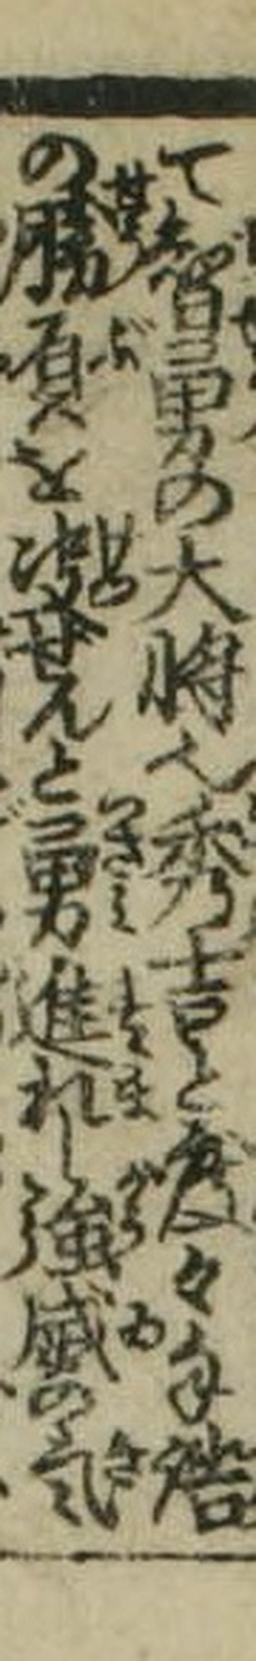の勝負を決せんと勇進れし強威の気
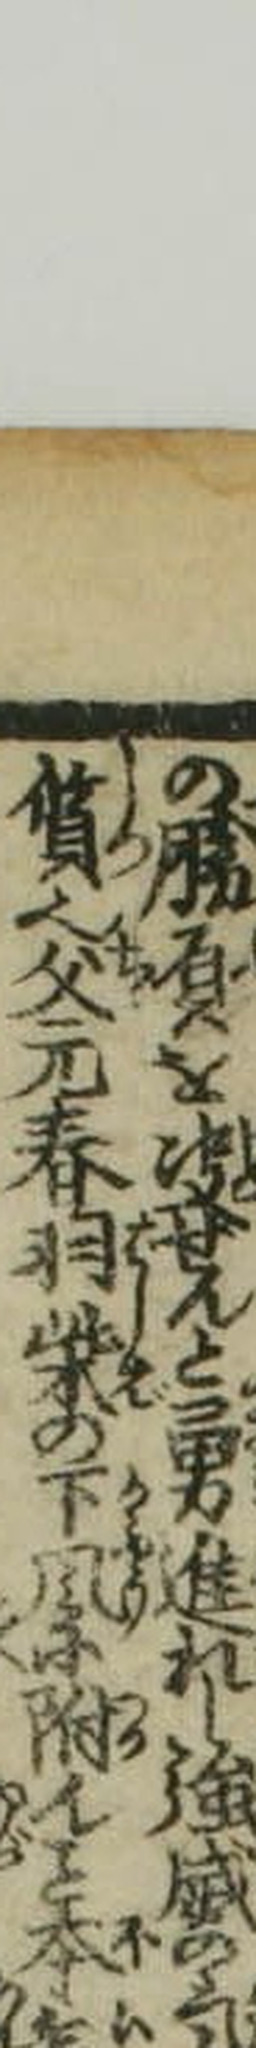質也父元春羽柴の下風に附んこと本意
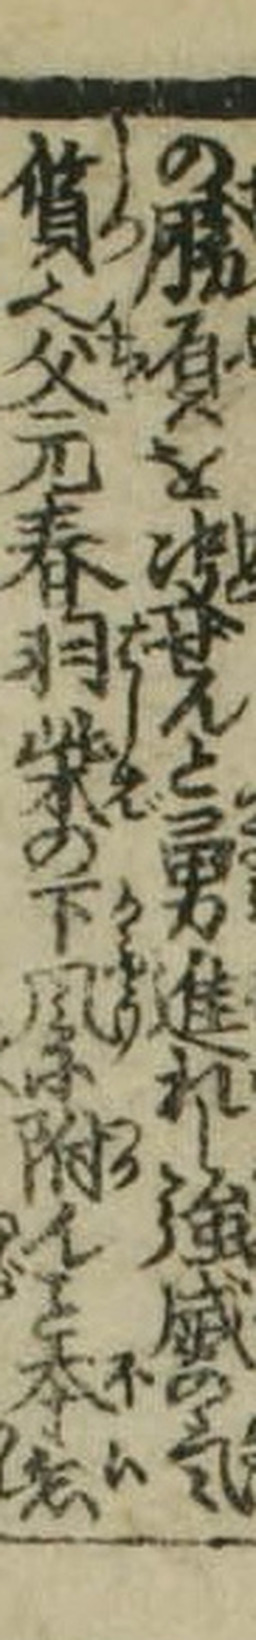質也父元春羽柴の下風に附んこと本意
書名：續英雄百人一首
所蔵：東京学芸大学附属図書館
